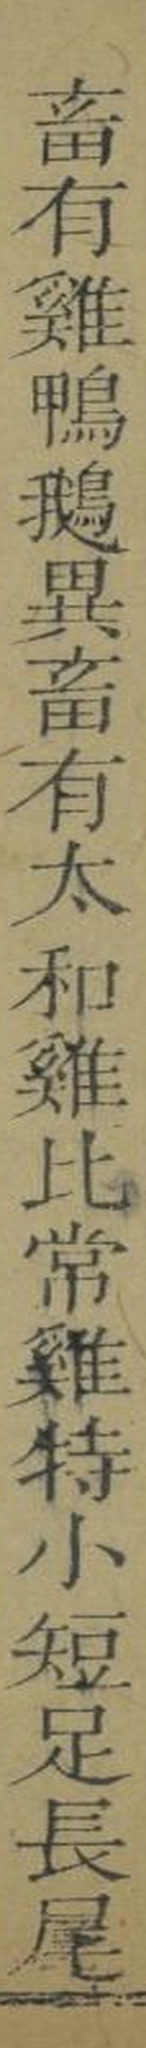畜有鶏鴨鵝異畜有太和鶏比常鶏特小短足長尾
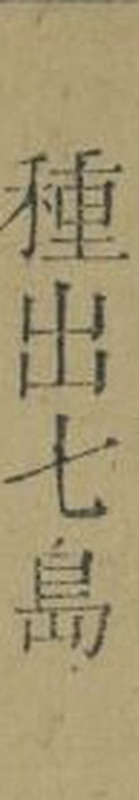種出七島
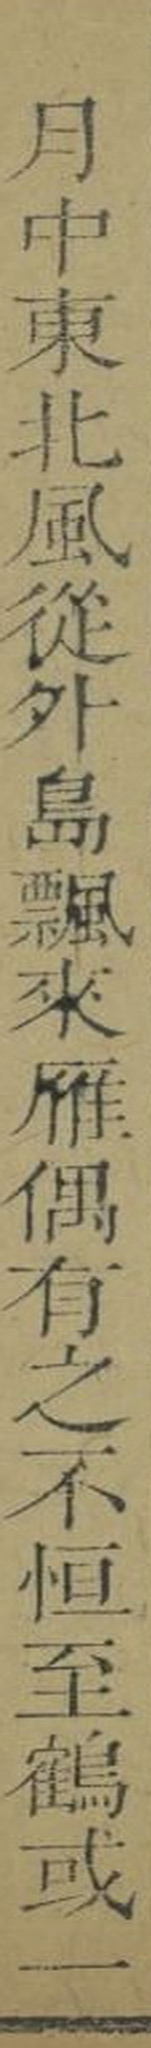月中東北風従外島飄来雁偶有之不恒至鶴或一
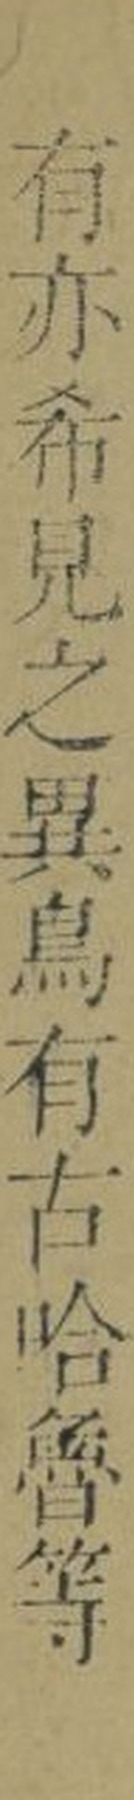有亦希見之異鳥有古哈魯等
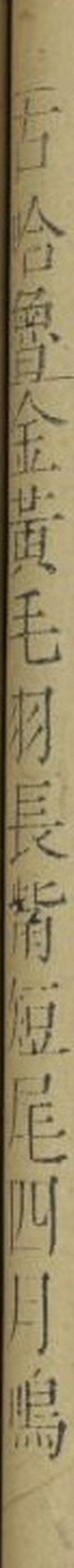[古哈魯]金黄毛羽長觜短尾四月鳴
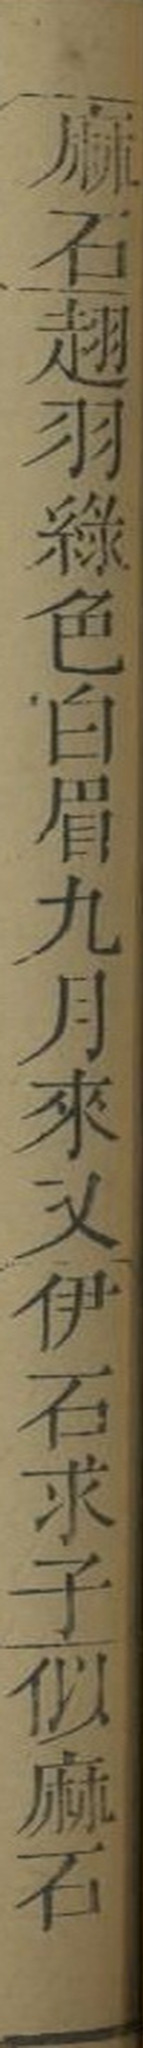[麻石]趐羽緑色白眉九月来又[伊石求子]似麻石
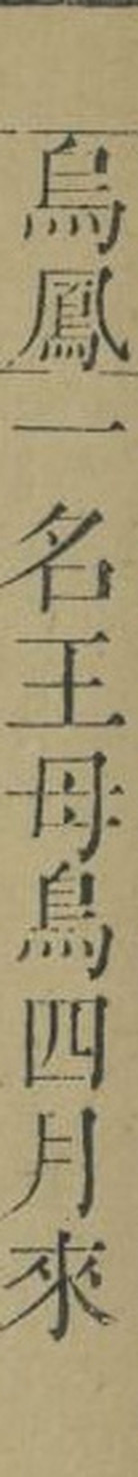[烏鳳]一名王母鳥四月来
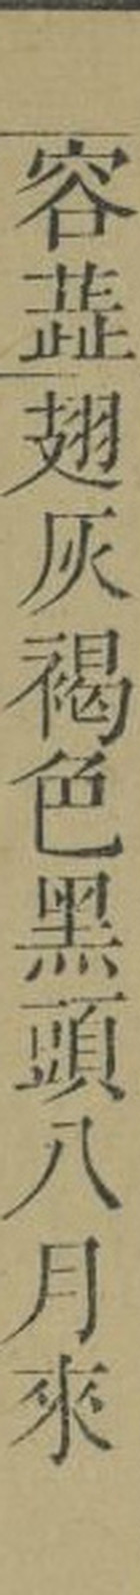[容蕋]翅灰褐色黒頭八月来
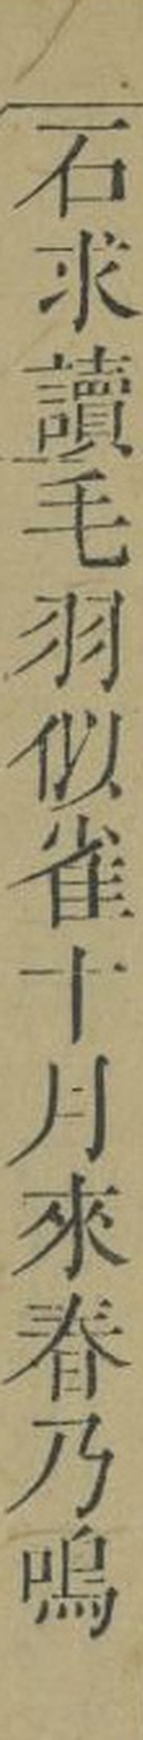[石求読]毛羽似雀十月来春乃鳴
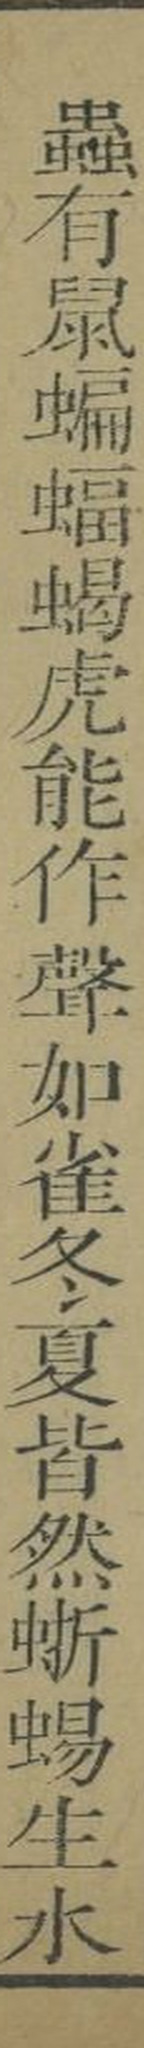虫有鼠蝙蝠蝎虎能作声如雀冬夏皆然蜥蜴生水
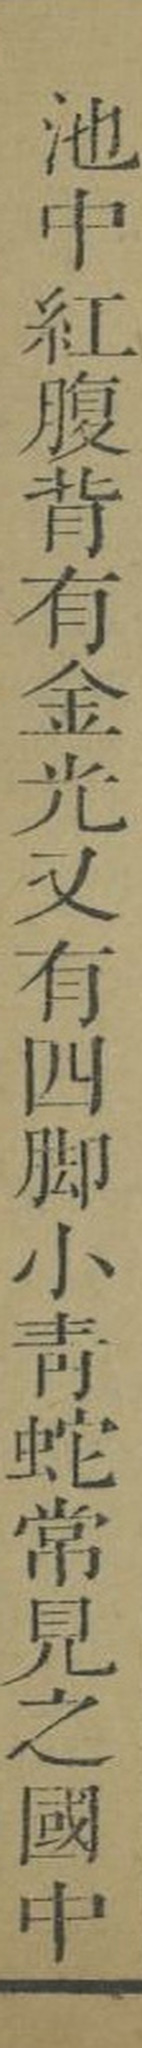池中紅腹背有金光又有四脚小青蛇常見之国中

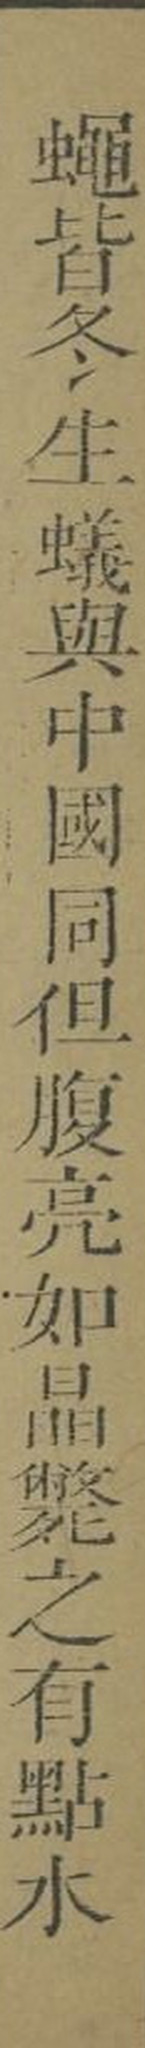蠅皆冬生蟻与中国同但腹亮如晶斃之有点水
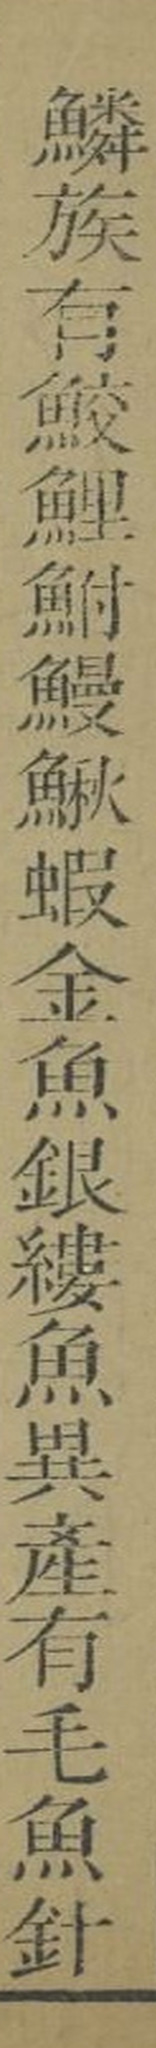鱗族有鮫鯉鮒鰻鰍蝦金魚銀縷魚異産有毛魚針
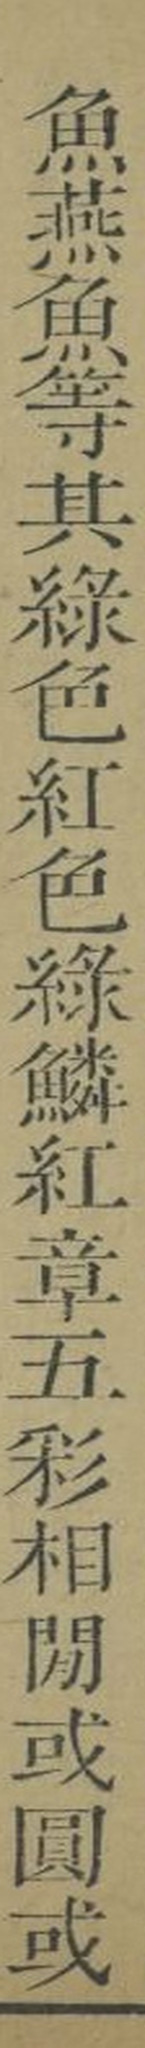魚燕魚等其緑色紅色緑鱗紅章五彩相間或円或
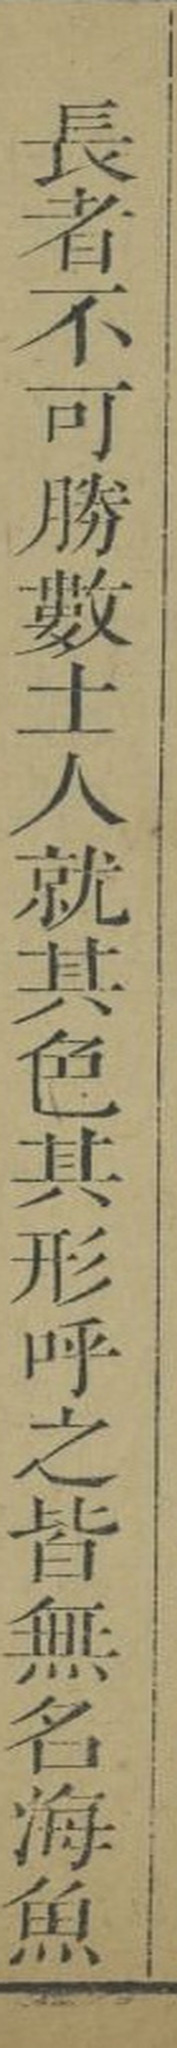長者不可勝数土人就其色其形呼之皆無名海魚
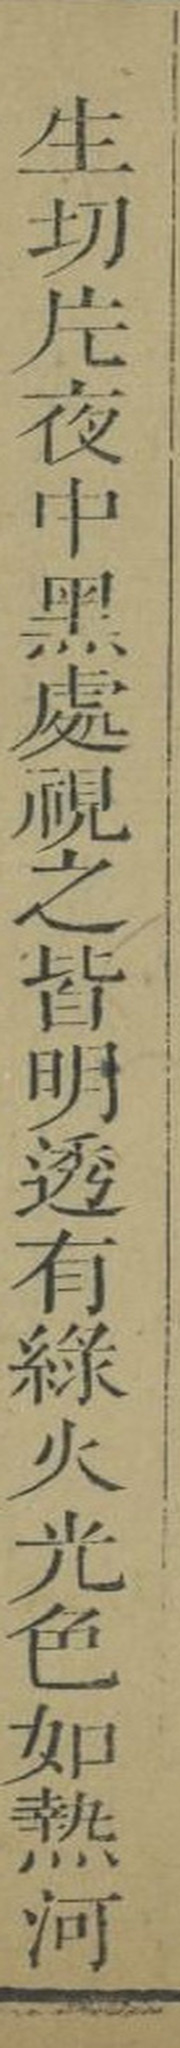生切片夜中黒処視之皆明透有緑火光色如熱河
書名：中山伝信録 巻六
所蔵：University of the Ryukyus Library
